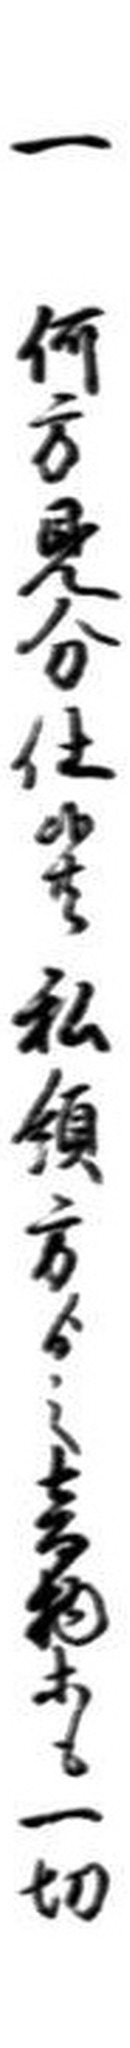一何方見分仕候共私領ゟ之音物等も一切
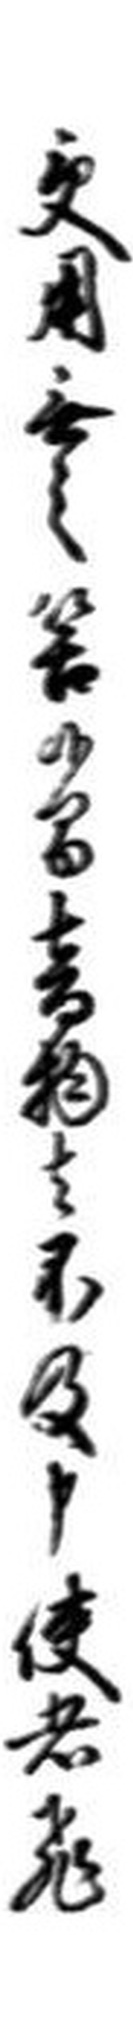受用無之筈候間音物者不及申使者飛
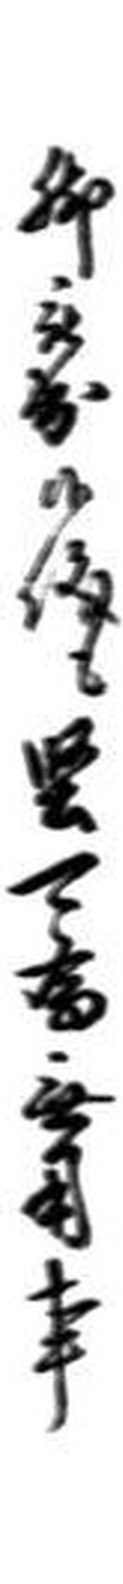脚被出候儀も堅可為無用事

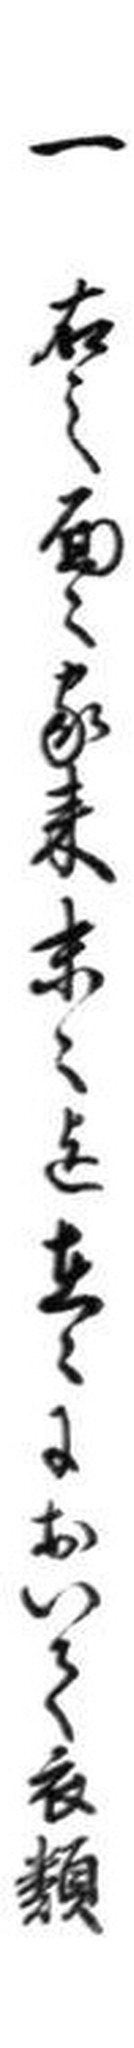一右之面々家来末々迄在々において衣類
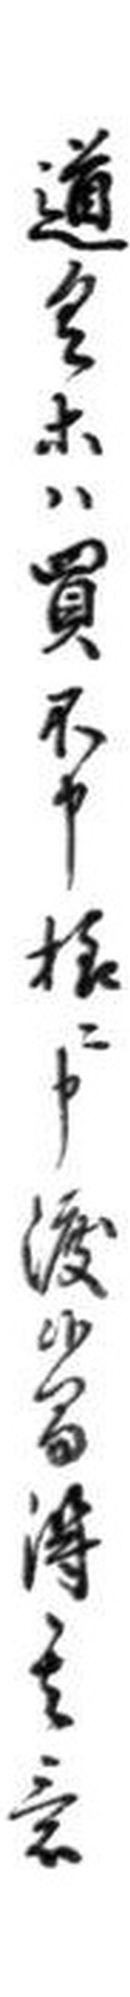道具等ハ買不申様ニ申渡候間得其意
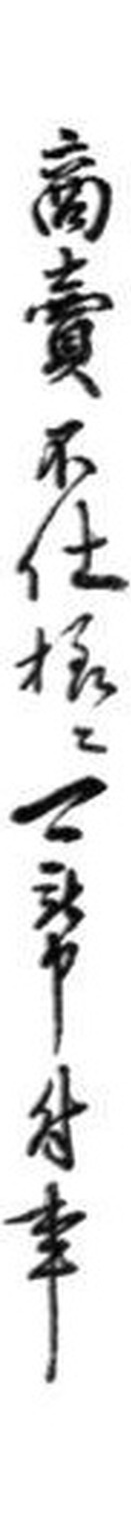商売不仕様ニ可被申付事
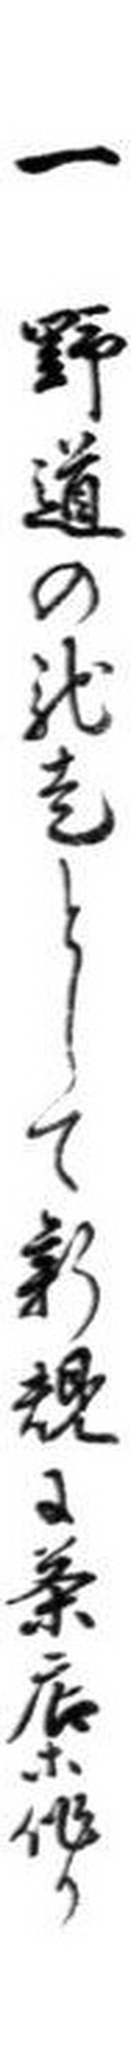一野道の馳走として新規に茶店等作り
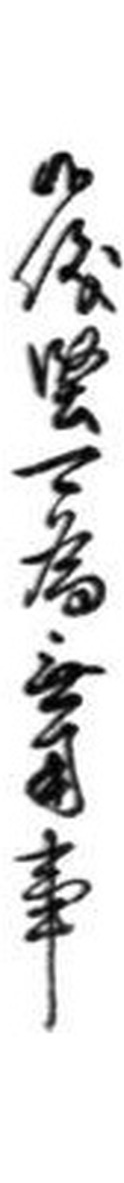候儀堅可為無用事
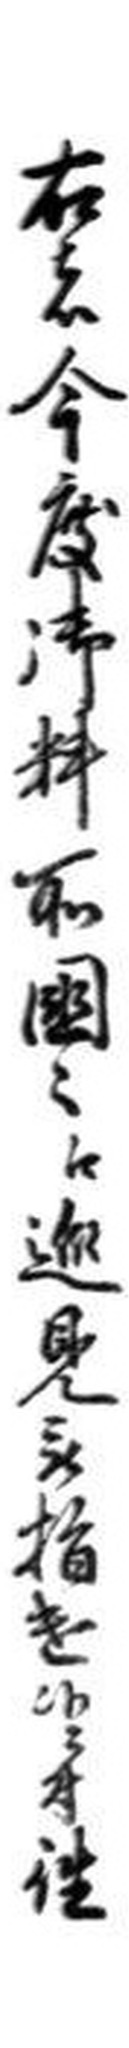右者今度御料所国々江巡見被指遣候ニ付往
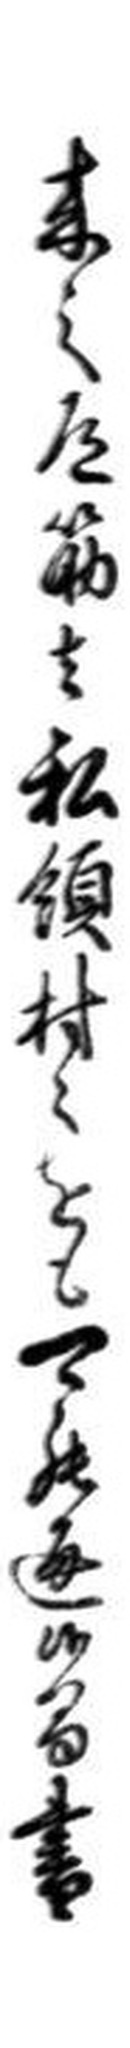来之道筋者私領村々をも可罷通候間書
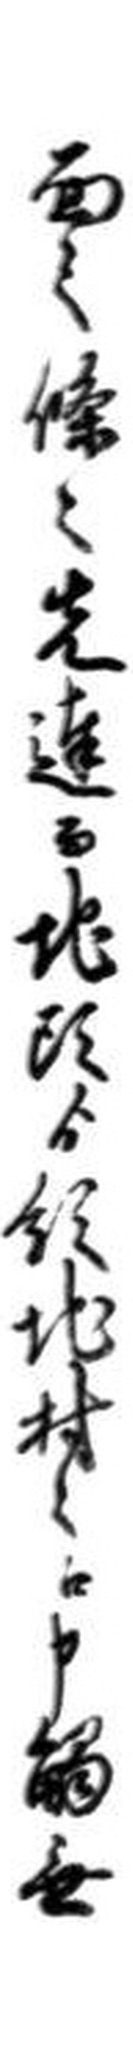面之条々先達而地頭ゟ領地村々江申触無
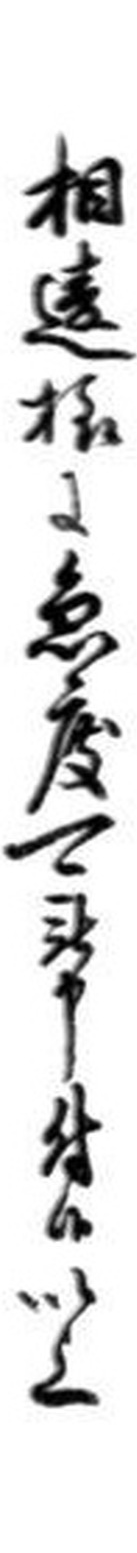相違様に急度可被申付候以上
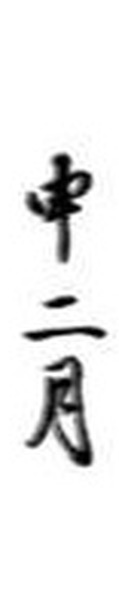申二月
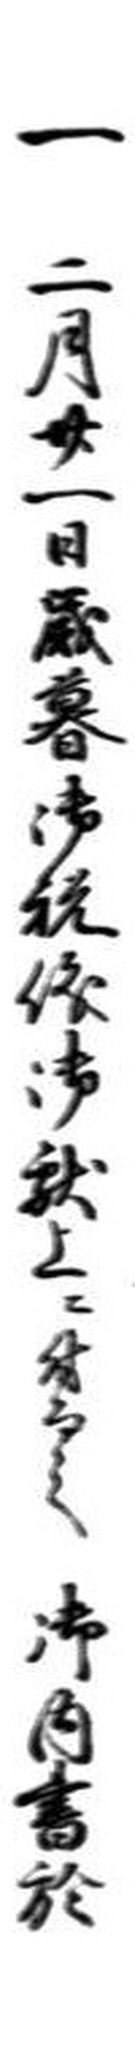一二月廿一日歳暮御祝儀御献上ニ付而之御内書於
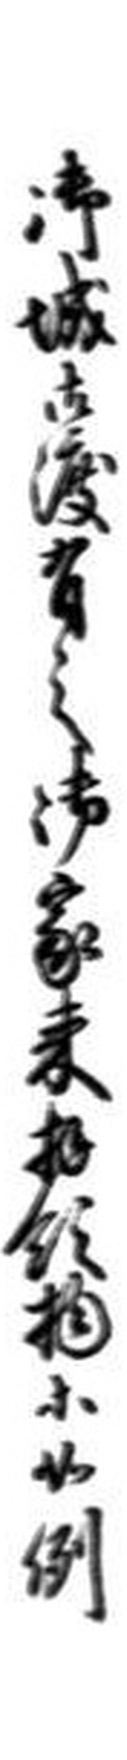御城御渡有之御家来拝領物等如例
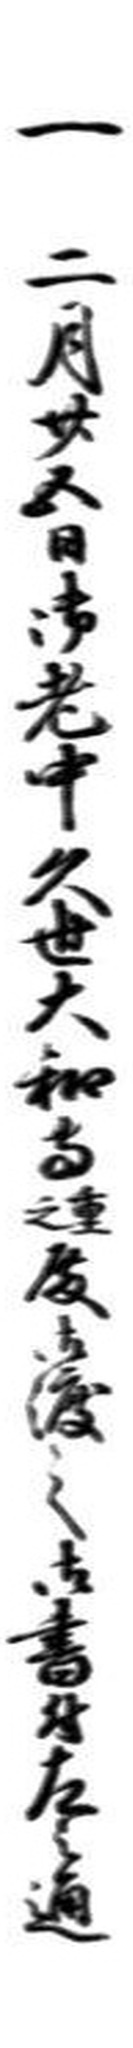一二月廿五日御老中久世大和守重之殿御渡之御書付左之通
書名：家譜 三十一 吉邦公 享保元年
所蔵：福井県文書館 Fukui Prefectural Archives
